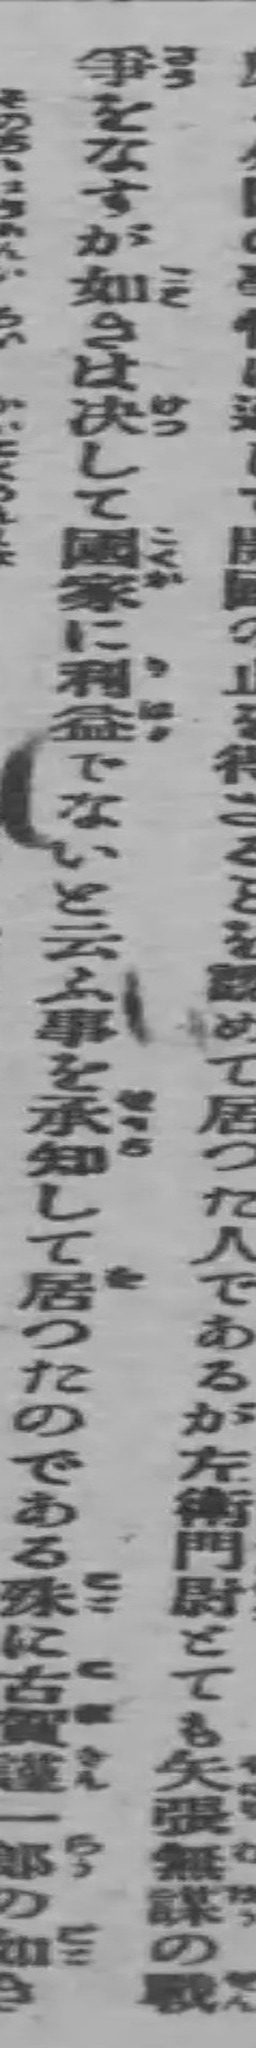争をなすが如きは決して国家に利益でないと云ふ事を承知して居つたのである殊に古賀謹一郎の如き
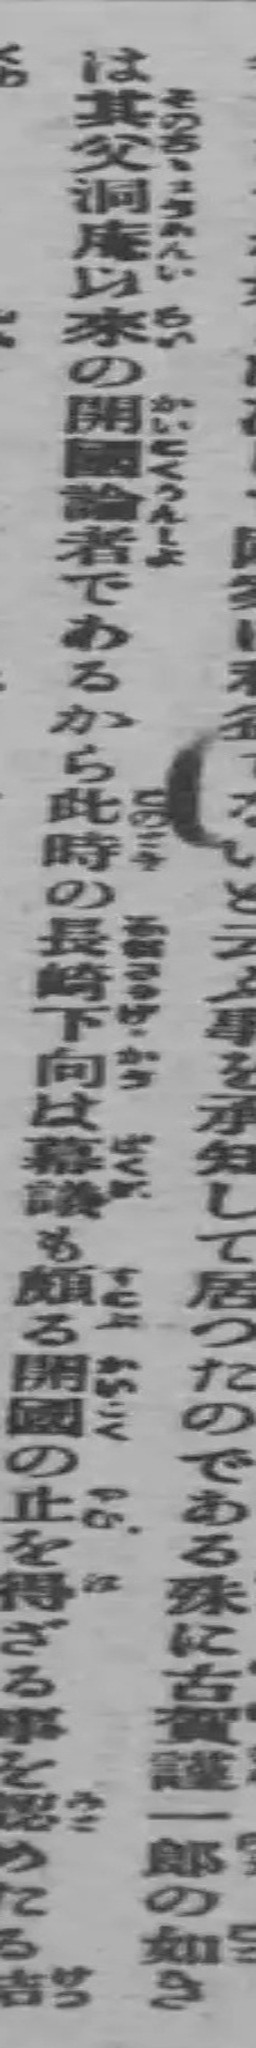は其父洞庵以来の開国論者であるから此時の長崎下向は幕議も頗る開国の止を得ざる事を認めたる結
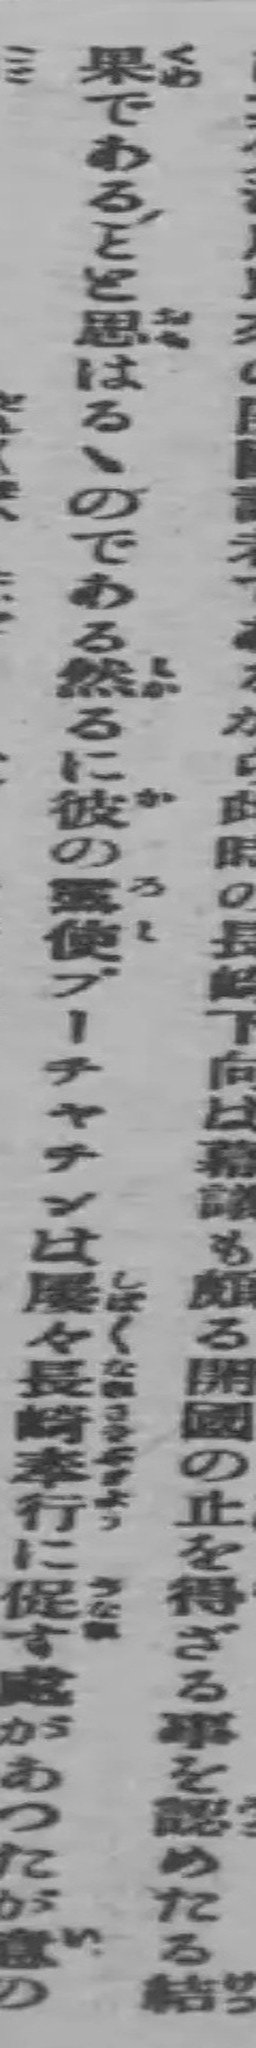果であることと思はるゝのである然るに彼の露使プーチヤチンは屡々長崎奉行に促す処があつたが意の
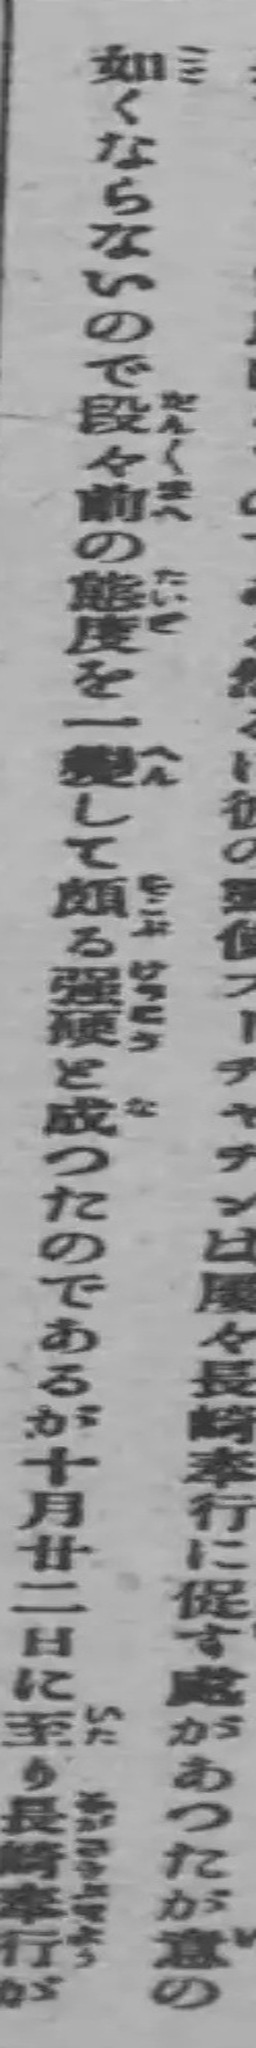如くならないので段々前の態度を一変して頗る強硬と成つたのであるが十月廿二日に至り長崎奉行が
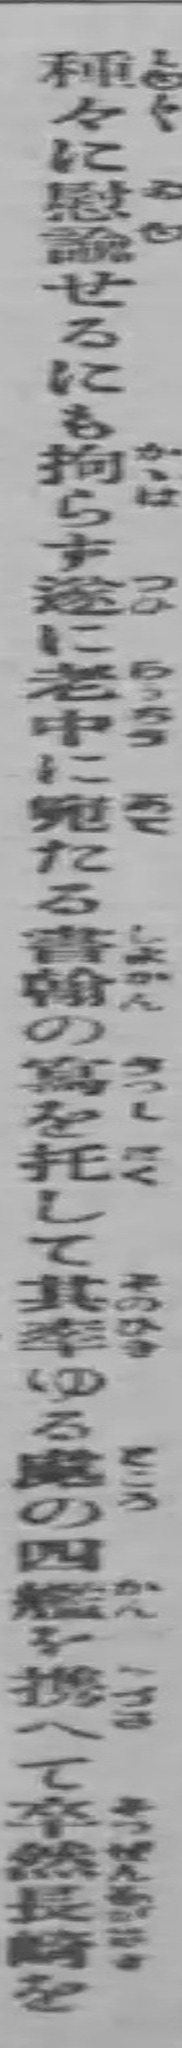種々に慰諭せるにも拘らず遂に老中に宛たる書翰の写を托して其率ゆる処の四艦を携へて卒然長崎を
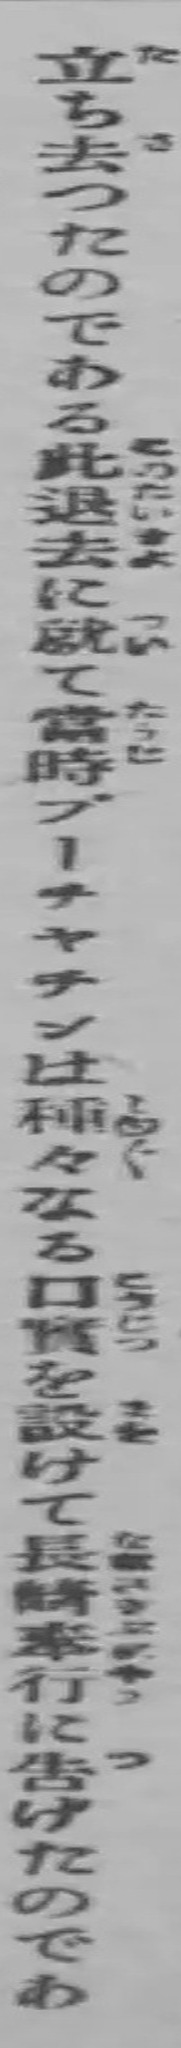立ち去つたのである此退去に就て当時プーチヤチンは種々なる口実を設けて長崎奉行に告げたのであ
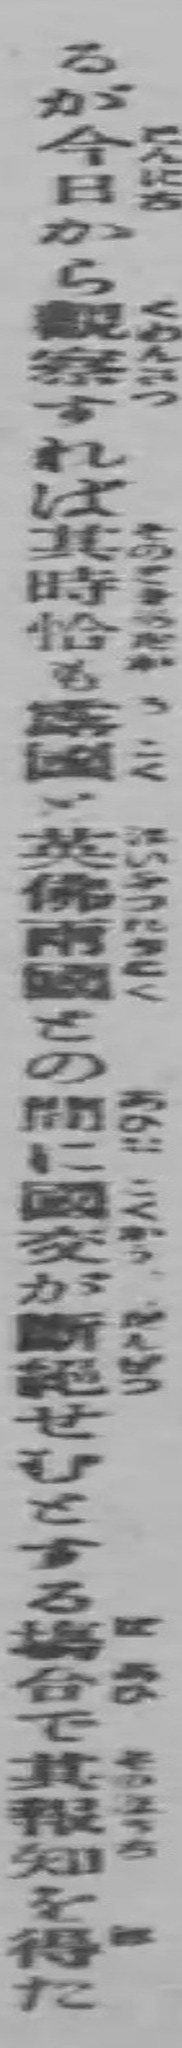るが今日から観察すれば其時恰も露国と英仏両国との間に国交が断絶せむとする場合で其報知を得た
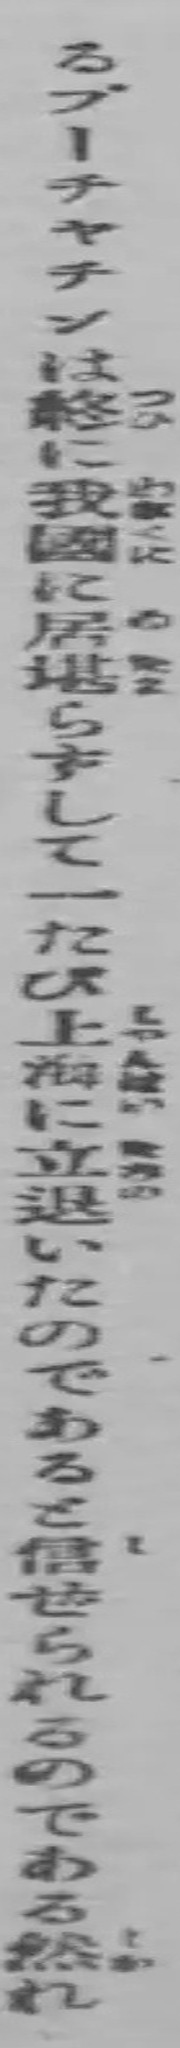るプーチヤチンは終に我国に居堪らずして一たび上海に立退いたのであると信ぜられるのである然れ
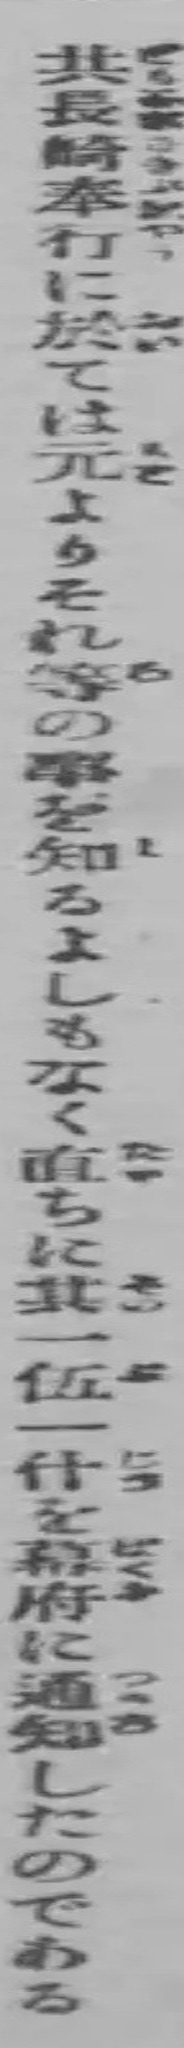共長崎奉行に於ては元よりそれ等の事を知るよしもなく直ちに其一伍一什を幕府に通知したのである
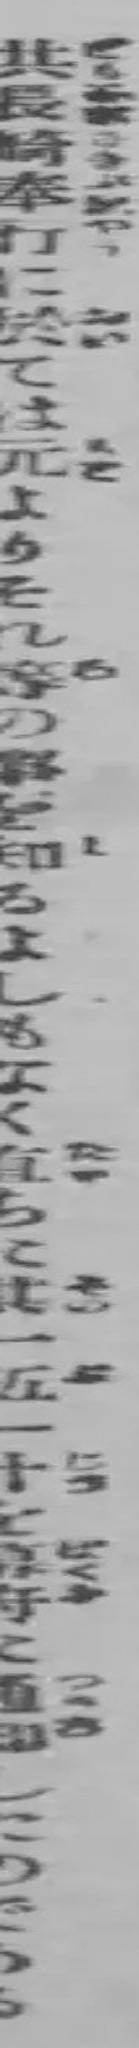共長崎奉行に於ては元よりそれ等の事を知るよしもなく直ちに其一伍一什を幕府に通知したのである
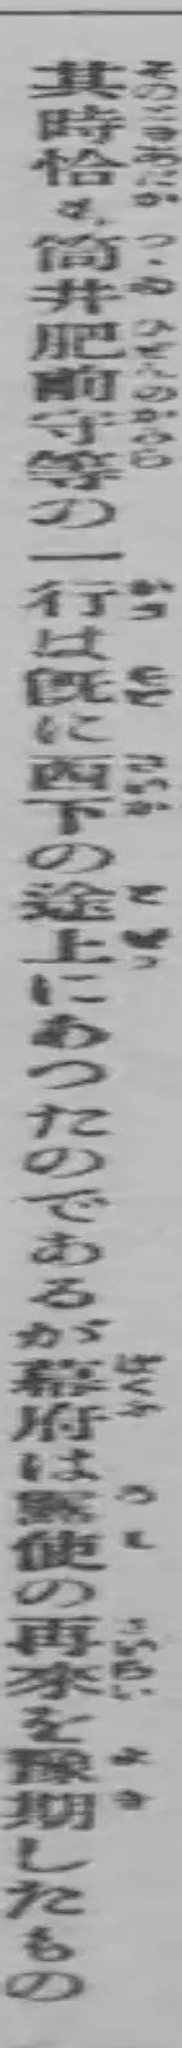其時恰も筒井肥前守等の一行は既に西下の途上にあつたのであるが幕府は露使の再来を予期したもの
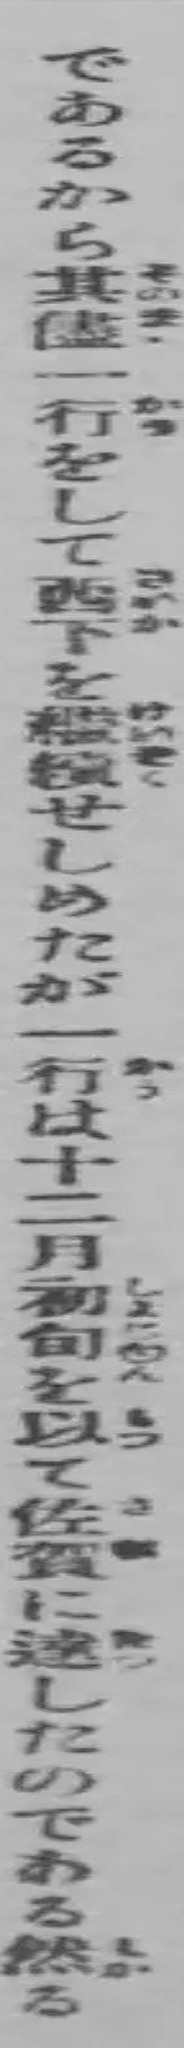であるから其侭一行をして西下を継続せしめたが一行は十二月初旬を以て佐賀に達したのである然る
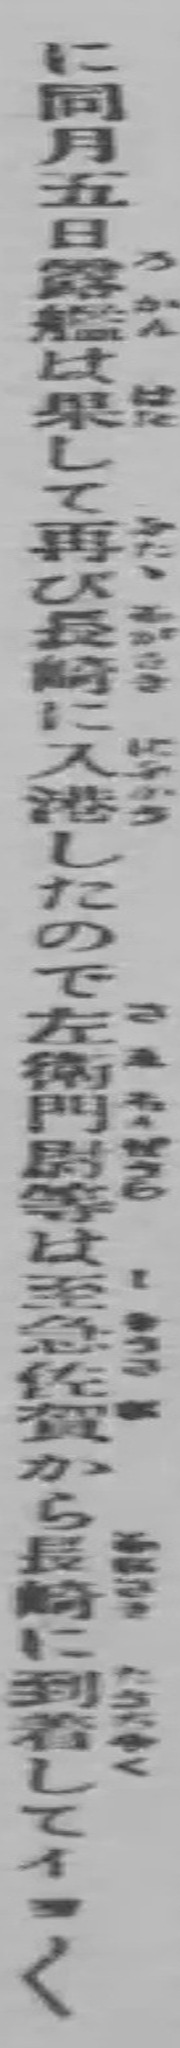に同月五日露艦は果して再び長崎に入港したので左衛門尉等は至急佐賀から長崎に到着してイヨ〳〵
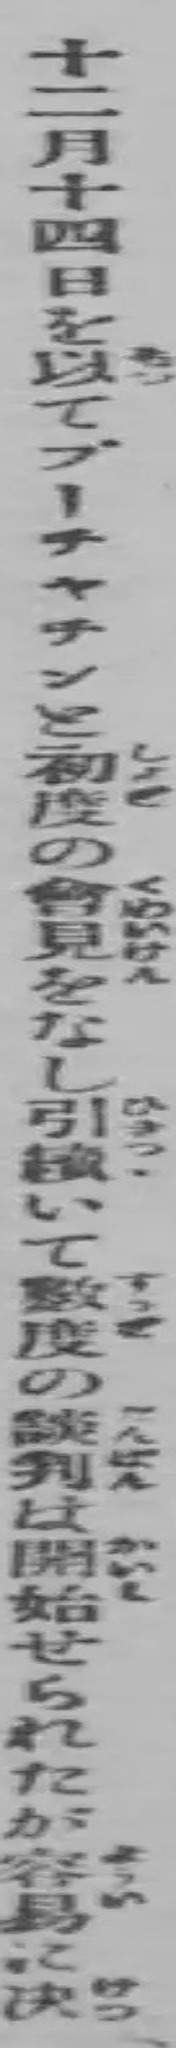十二月十四日を以てプーチヤチンと初度の会見をなし引続いて数度の談判は開始せられたが容易に決
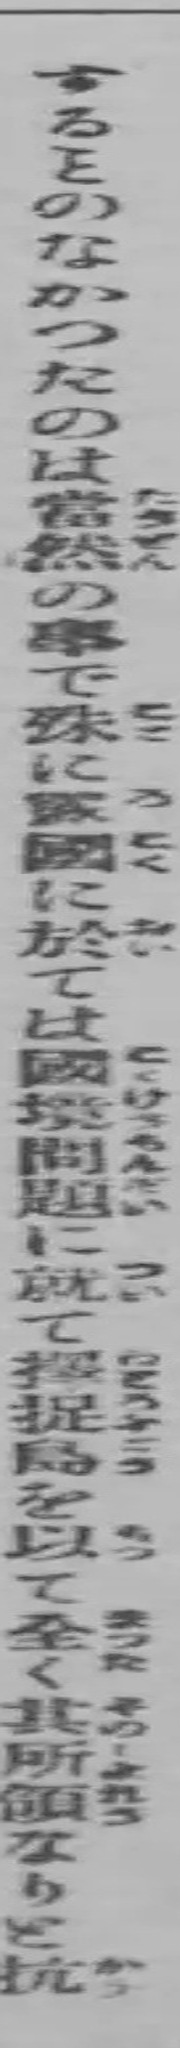することのなかつたのは当然の事で殊に露国に於ては国境問題に就て択捉島を以て全く其所領なりと抗
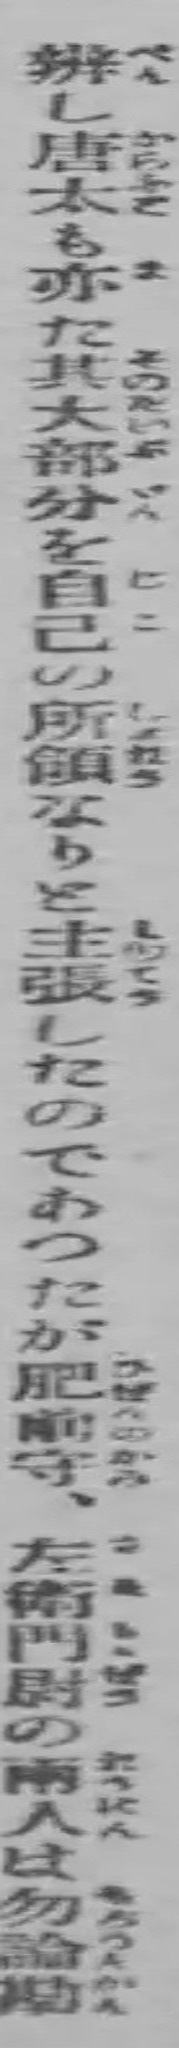弁し唐太も亦た其大部分を自己の所領なりと主張したのであつたが肥前守、左衛門尉の両人は勿論勘
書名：豊橋市史談
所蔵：国立国会図書館 National Diet Library, JAPAN
